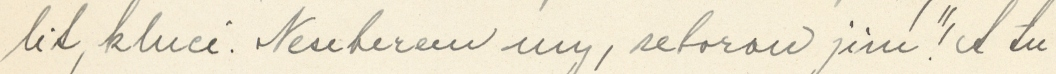lit, kluci. Neseberem my, seberou jiní.“ A tu-
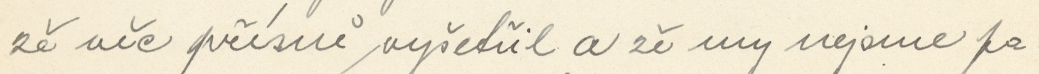že věc přísně vyšetřil a že my nejsme pa-
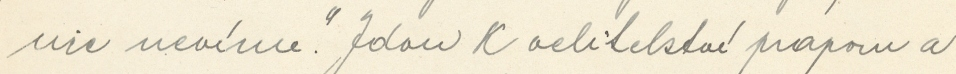nic nevíme.“ Jdou k velitelství praporu a
